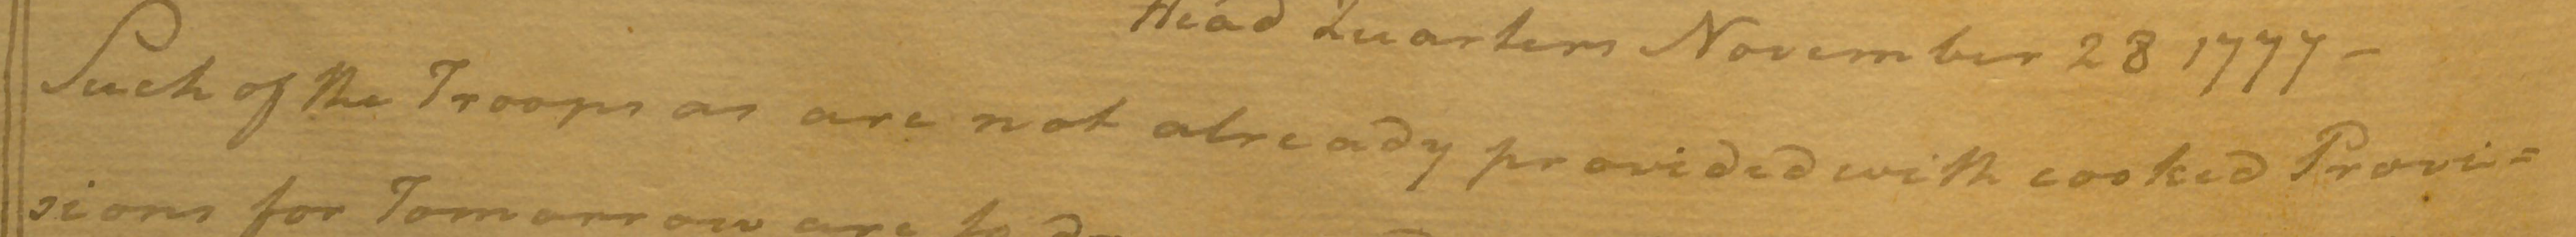Such of the Troops as are not already provided with cooked Provi-
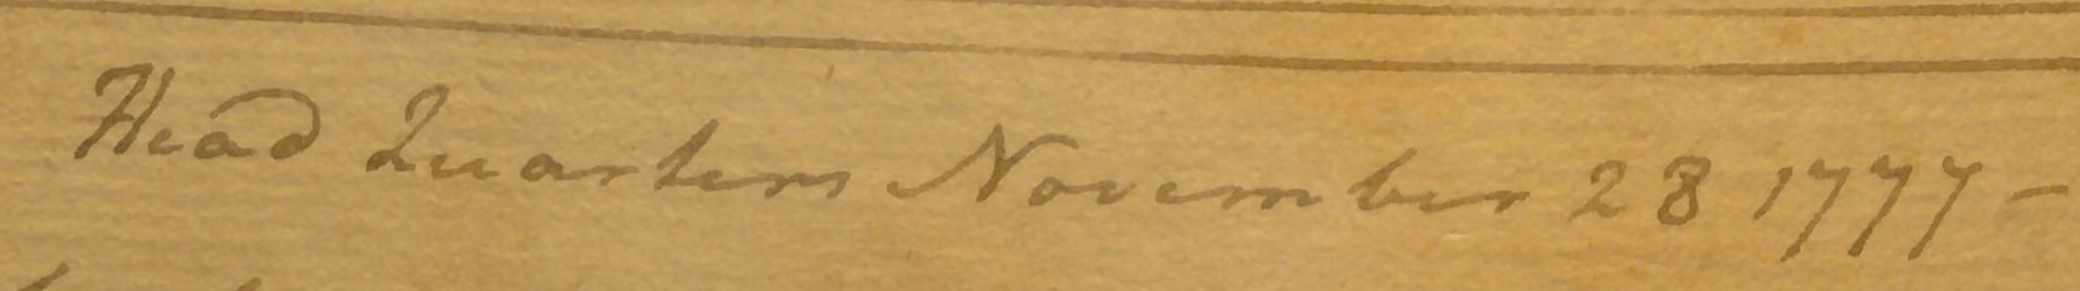Head Quarters November 28 1777-
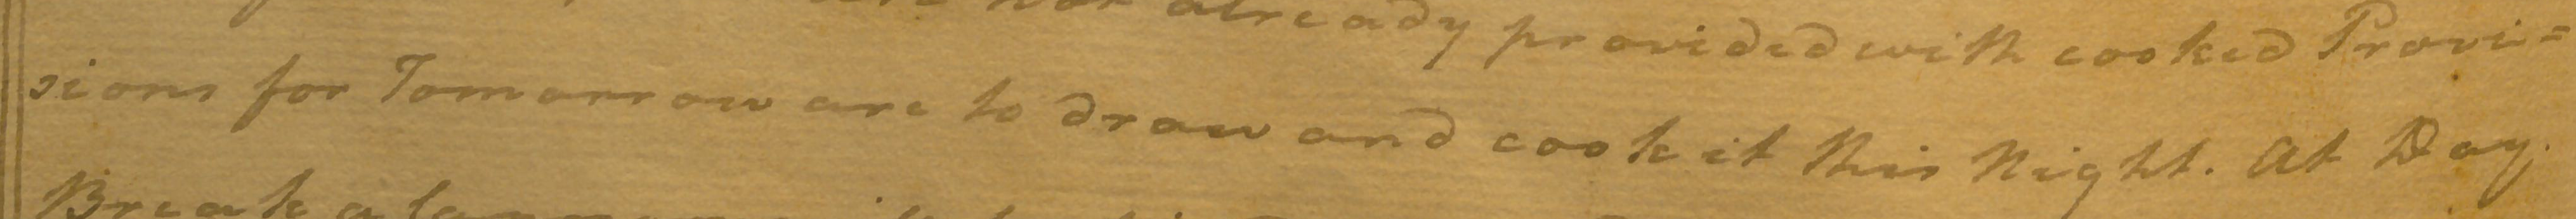sions for Tomorrow are to draw and cook it this Night. At Day
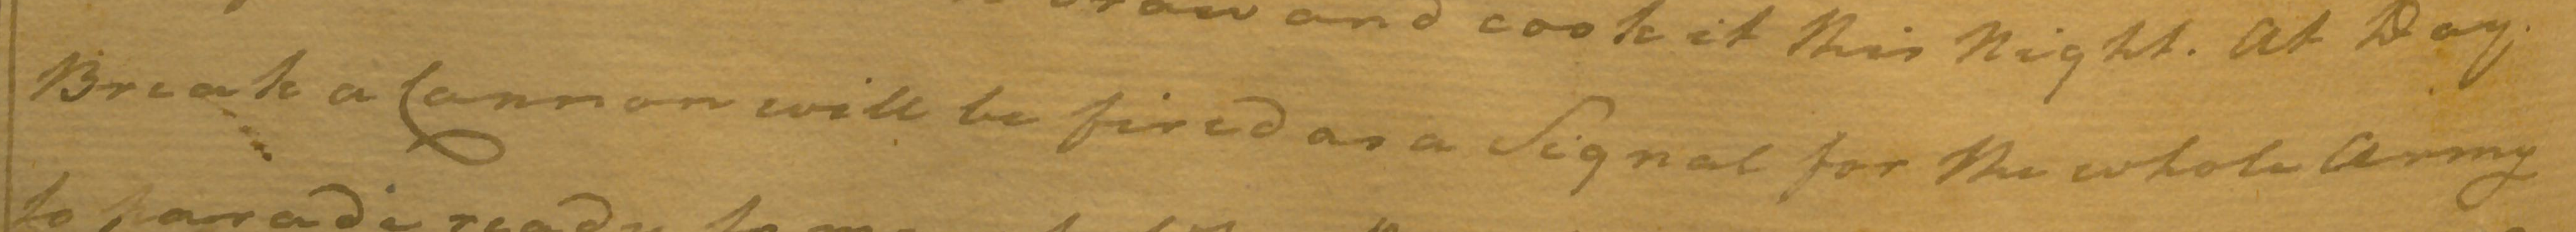Break a Cannon will be fired as a Signal for the whole army
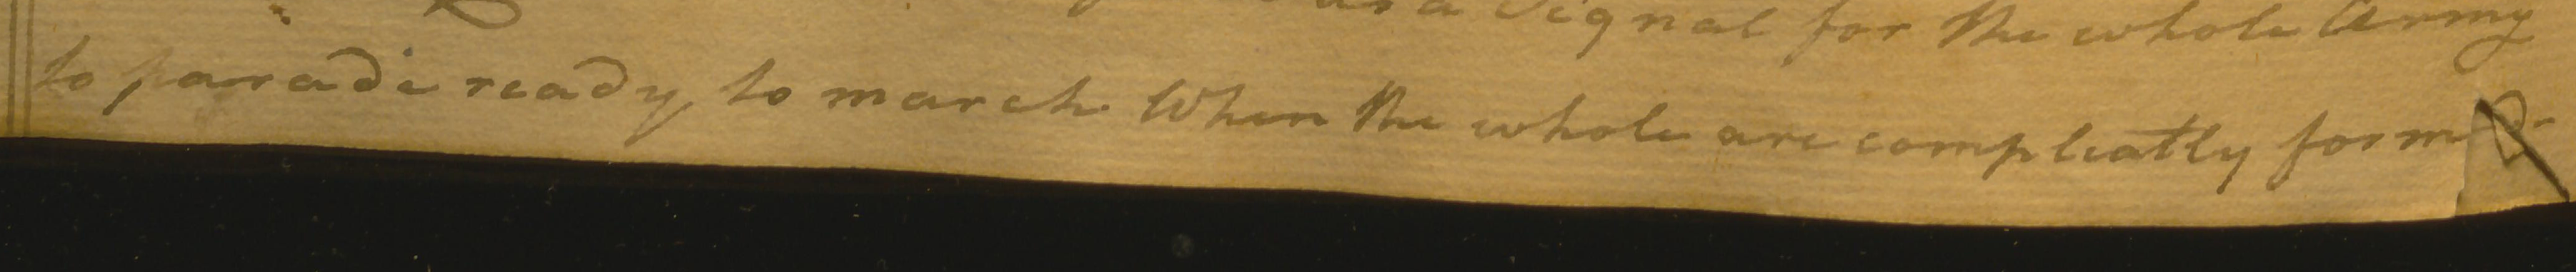to parade ready to march when the whole are completely formed-
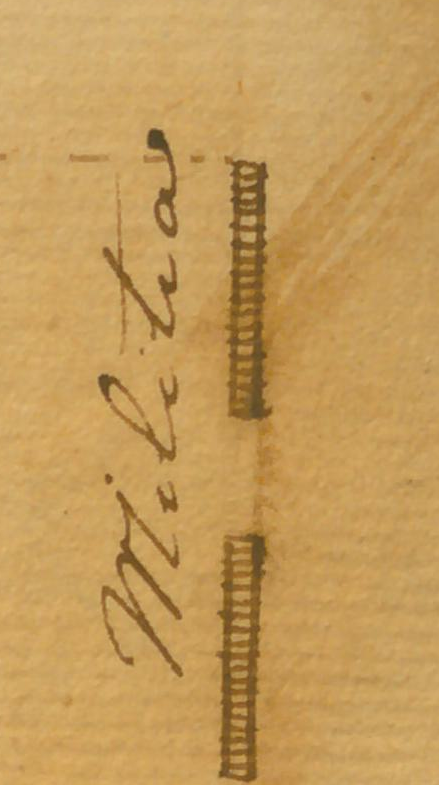Militia
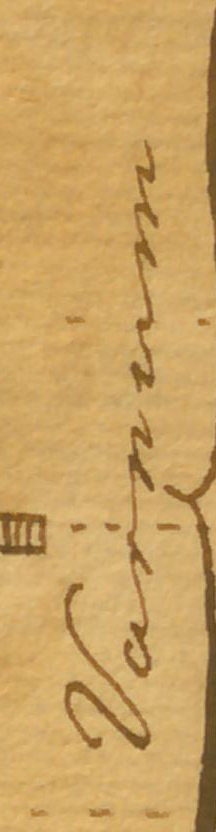Varnum
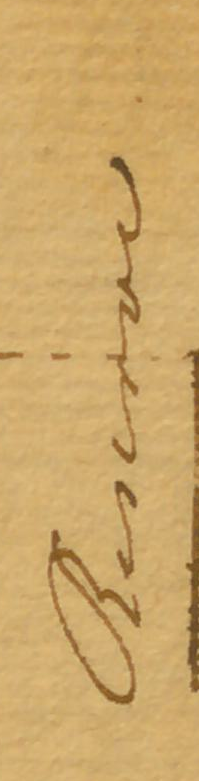Reserve
